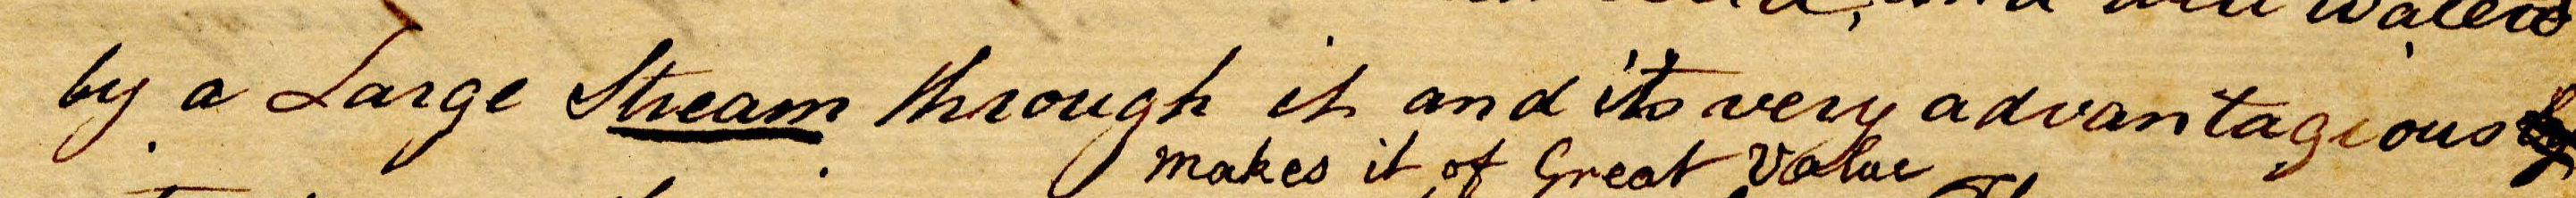by a Large Stream through it and its very advantageous &
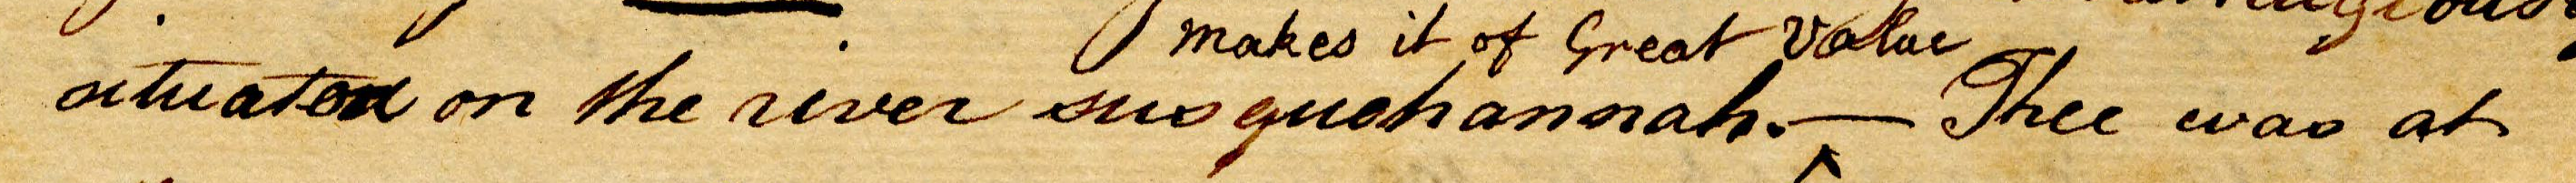situated on the river susquehannah.- ^ Thee was at
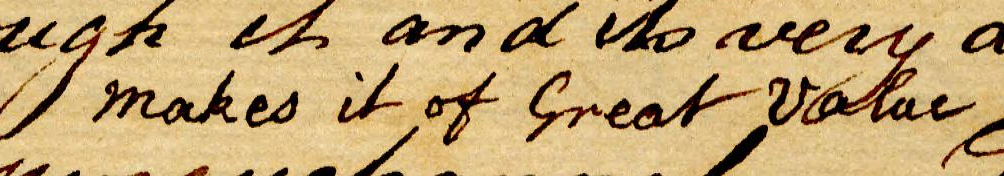makes it of Great Value
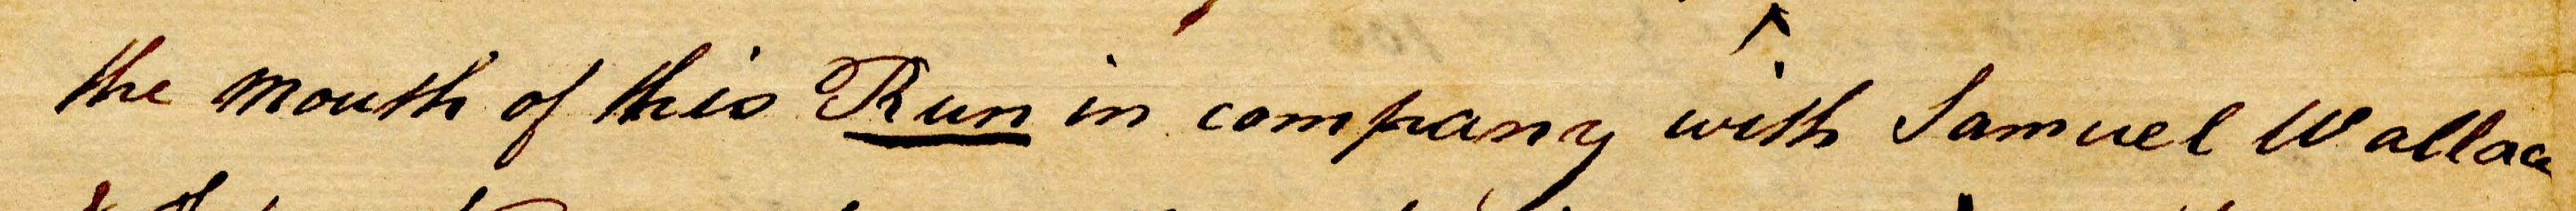the mouth of this Run in company with Samuel Wallace
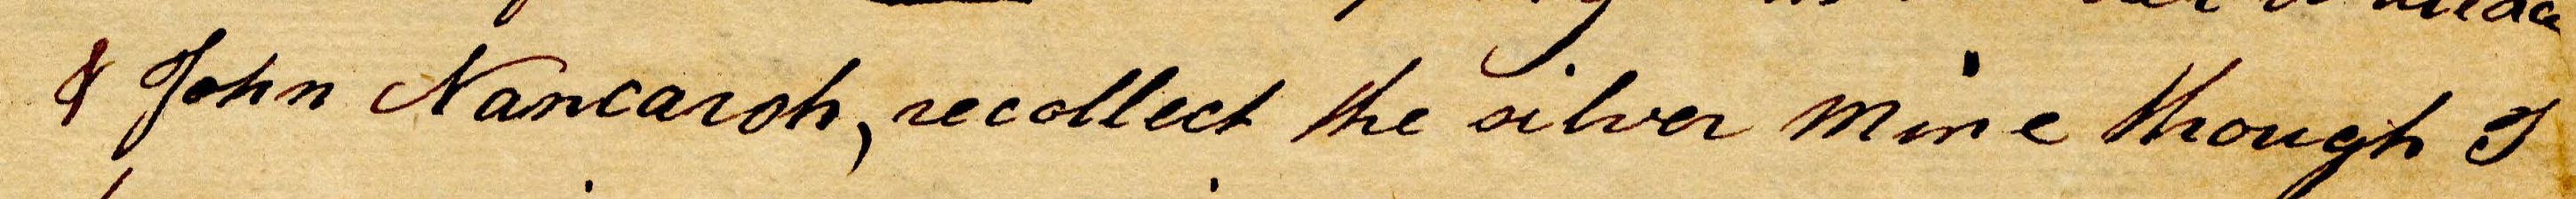& John Nancaroh, recollect the silver mine though I
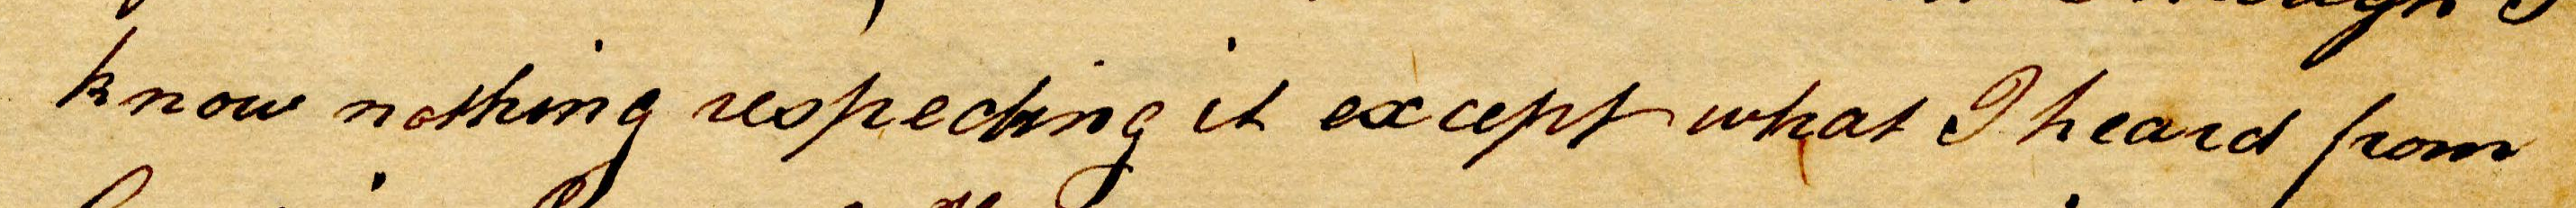know nothing respecting it except what I heard from
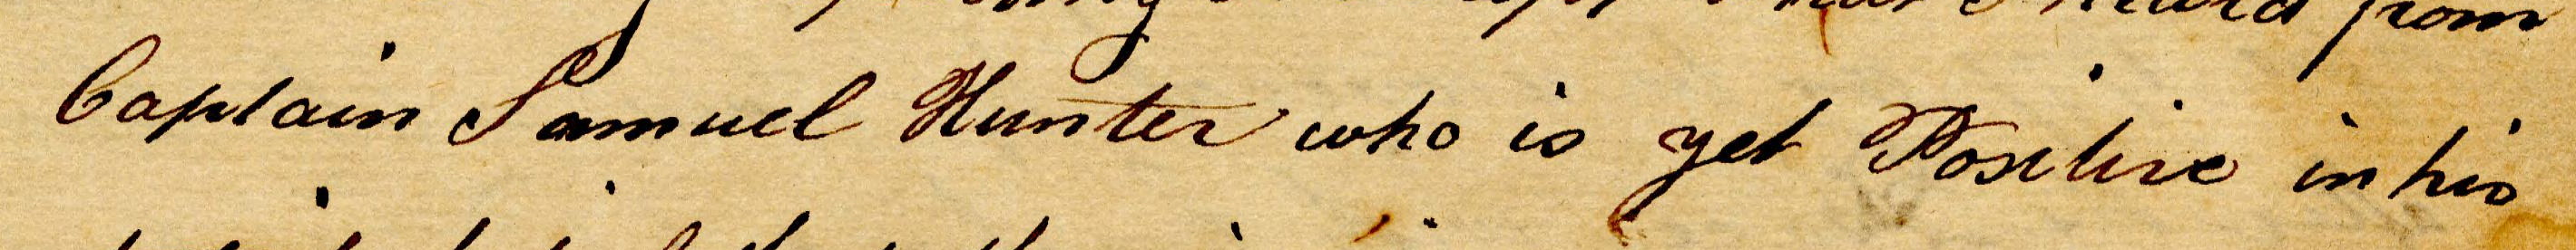Captain Samuel Hunter who is yet Positive in his
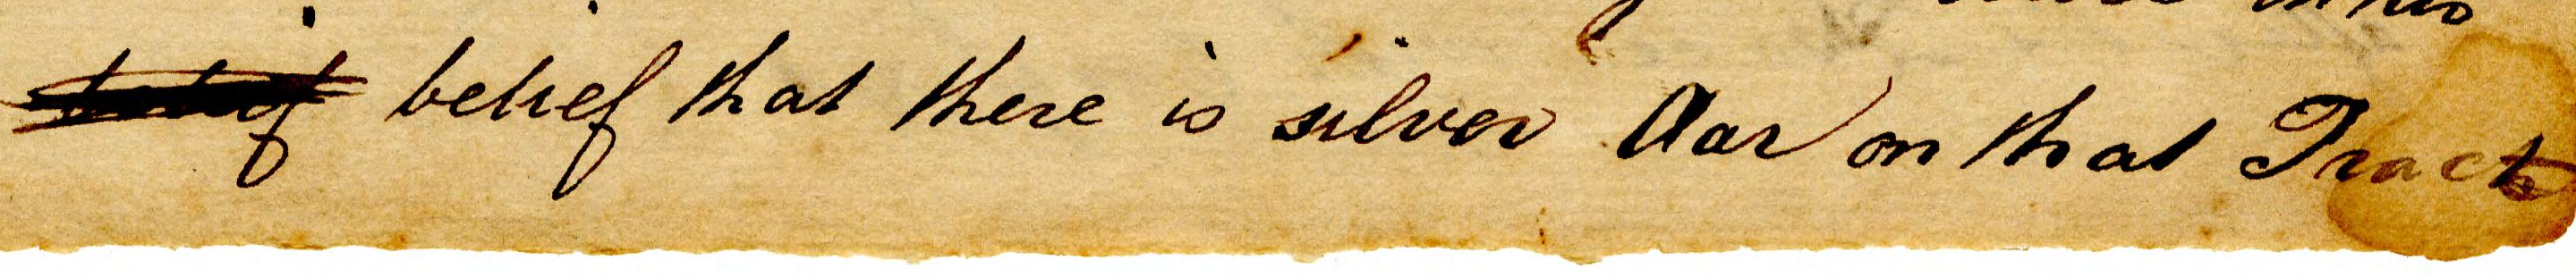[beleif] belief that there is silver Oar on that Tract
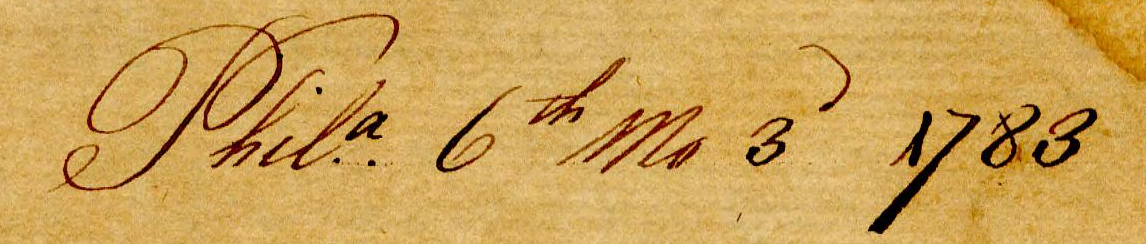Phil^a. 6^th mo 3^d 1783
